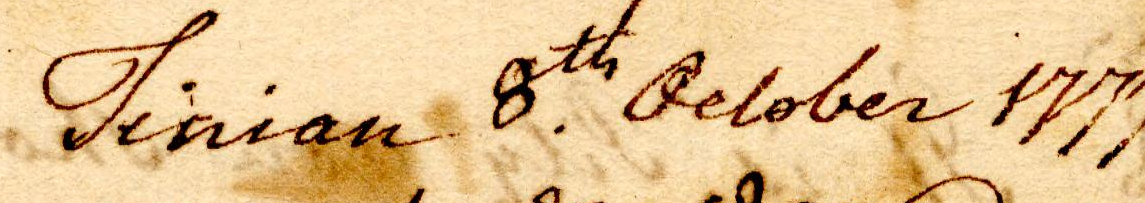Tinian 8^th. October 1777
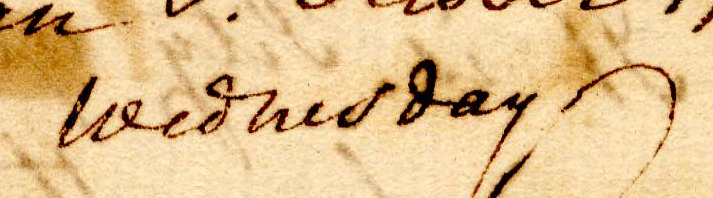Wednesday
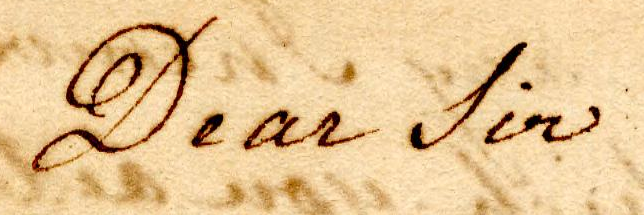Dear Sir
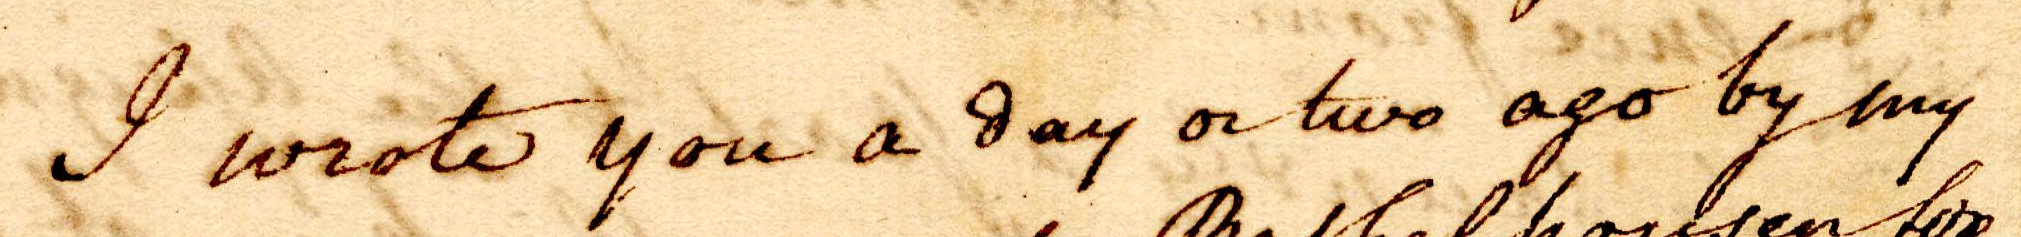I wrote you a day or two ago by my
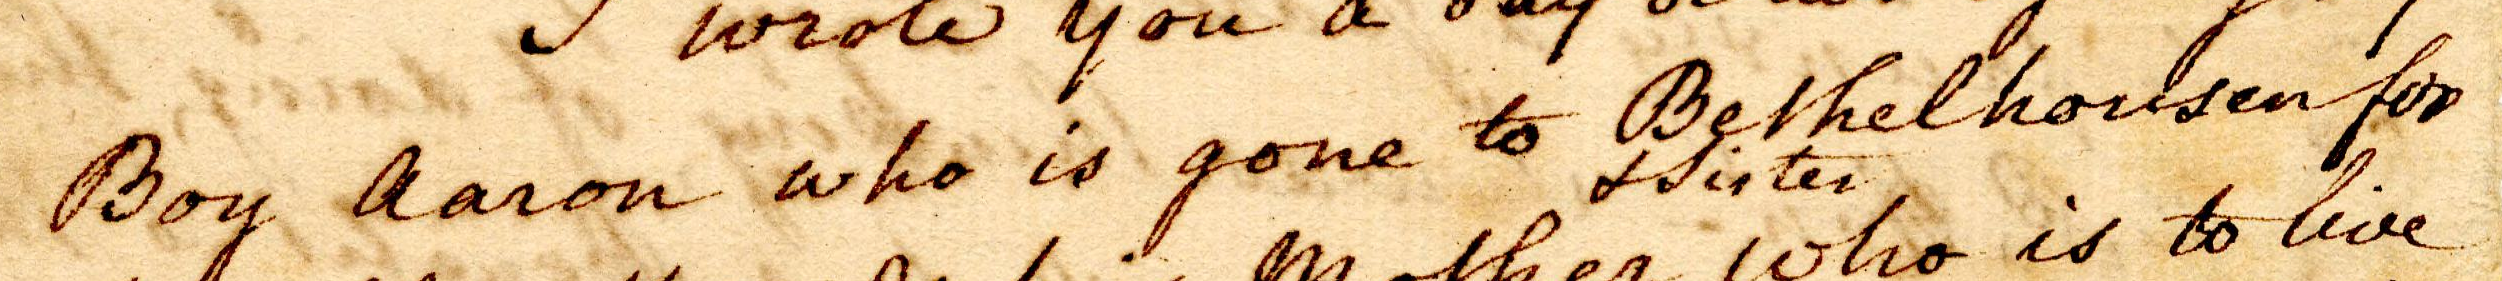Boy Aaron who is gone to Bethelhousen for
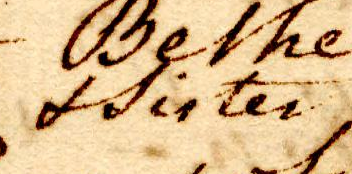& Sister
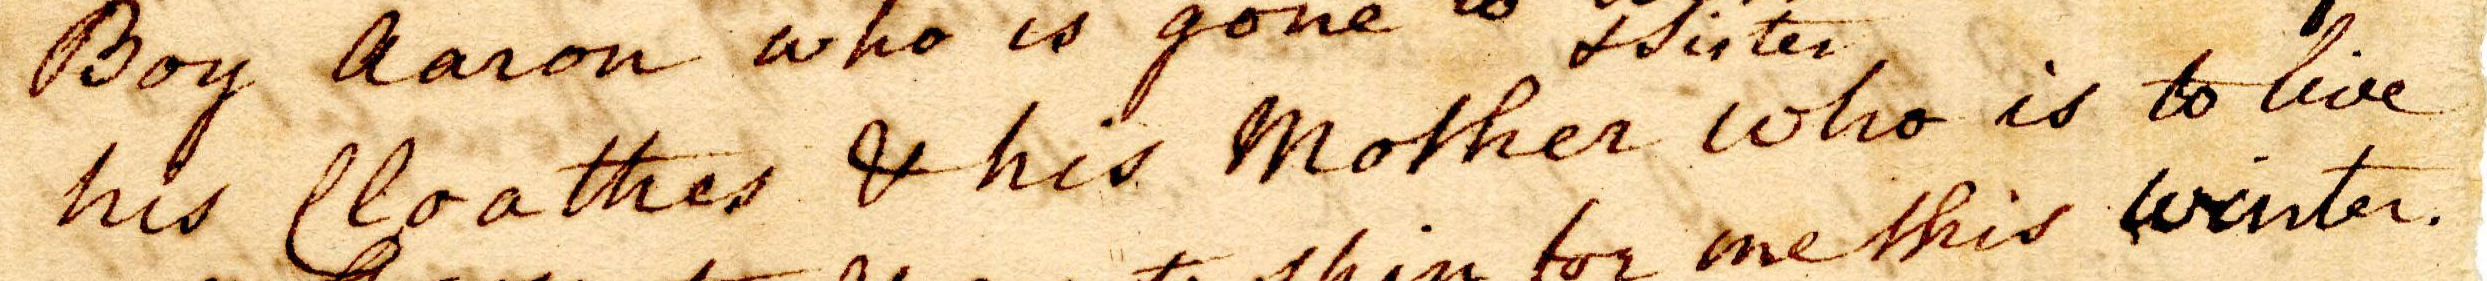his Cloathes & his Mother ^ who is to live
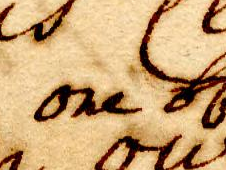one of
